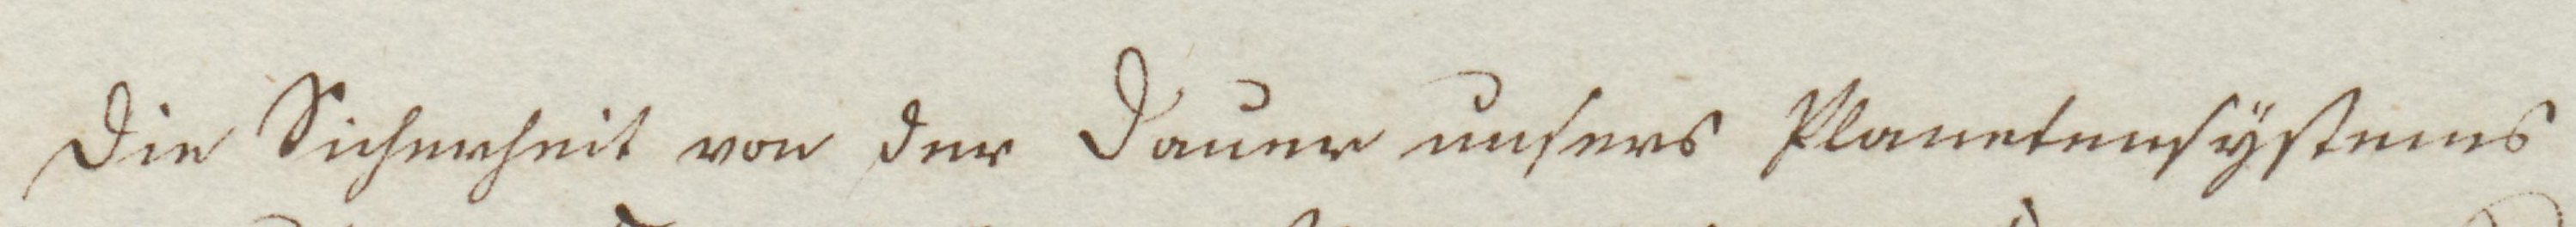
Die Sicherheit von der Dauer unsers Planetensÿstems
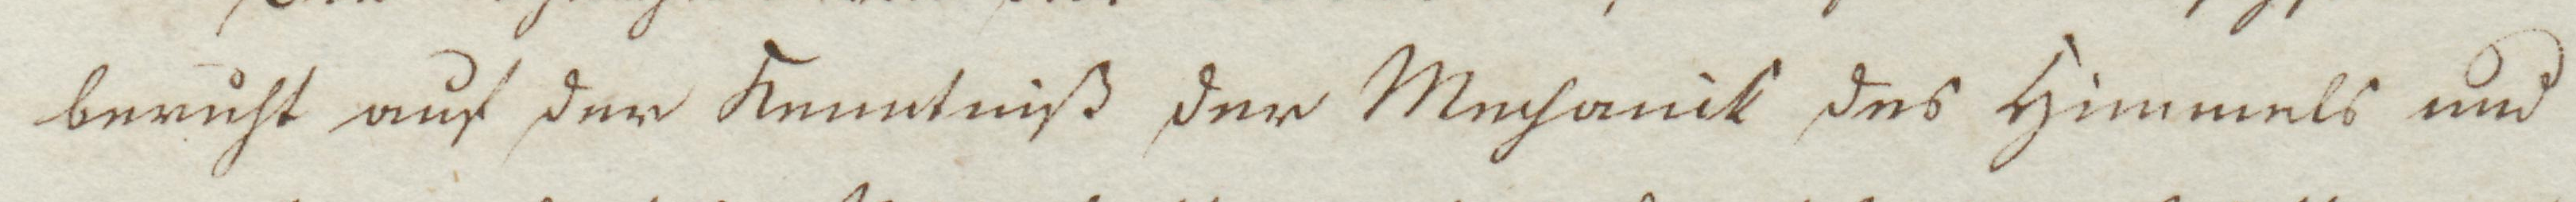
beruht auf der Kenntniß der Mechanik des Himmels und
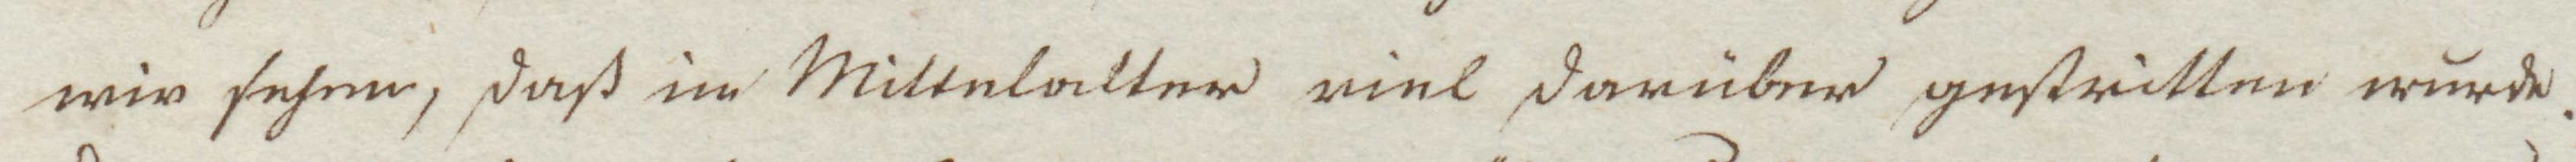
wir sehen, daß im Mittelalter viel darüber gestritten wurde.
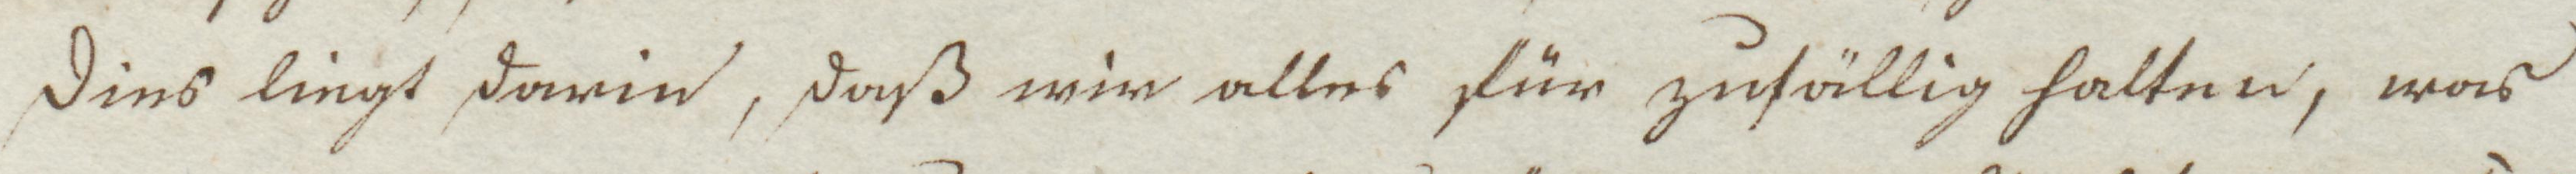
Dies liegt darin, daß wir alles für zufällig halten, was
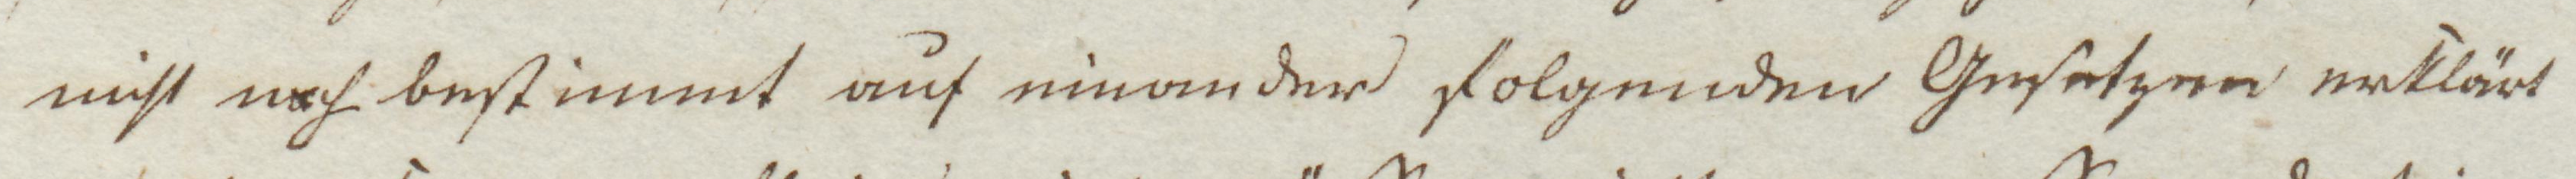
nicht noach bestimmt auf einander folgenden Gesetzen erklärt
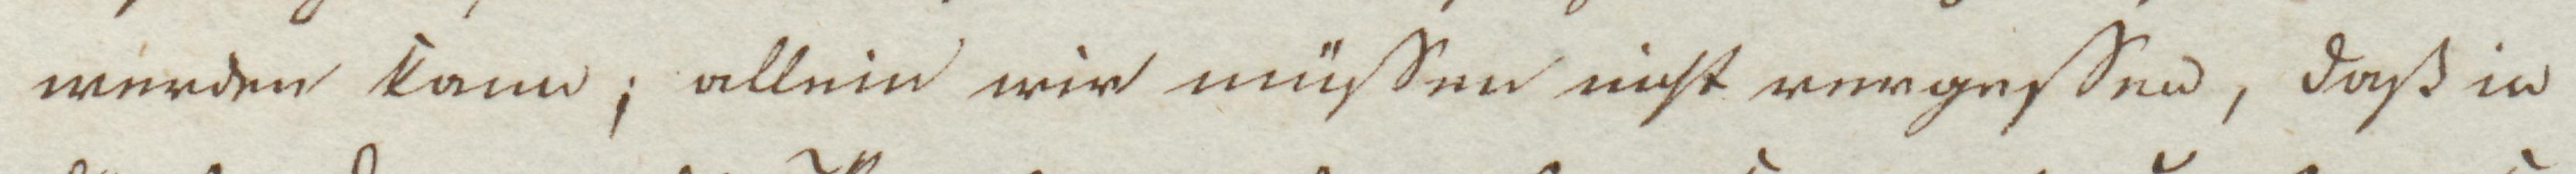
werden kann; allein wir müssen nicht vergessen, daß in
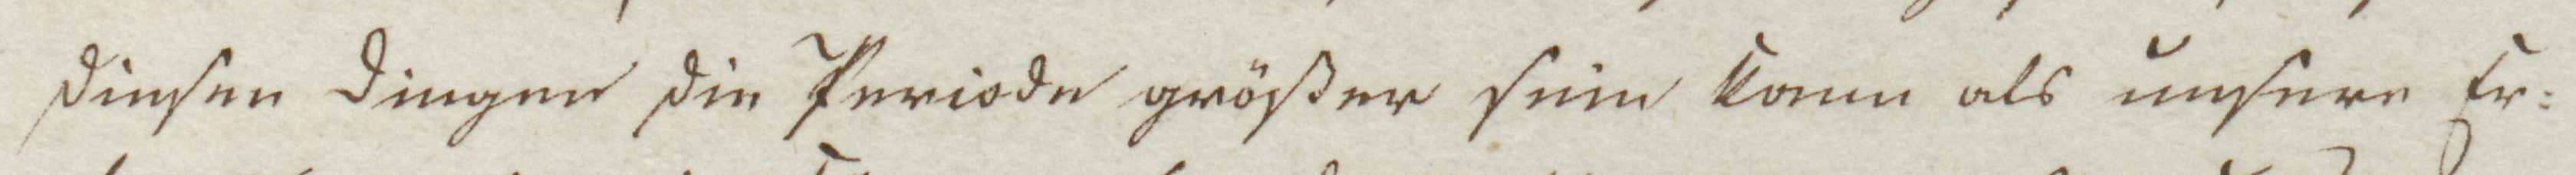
diesen Dingen die Periode größer sein kann als unsere Er-
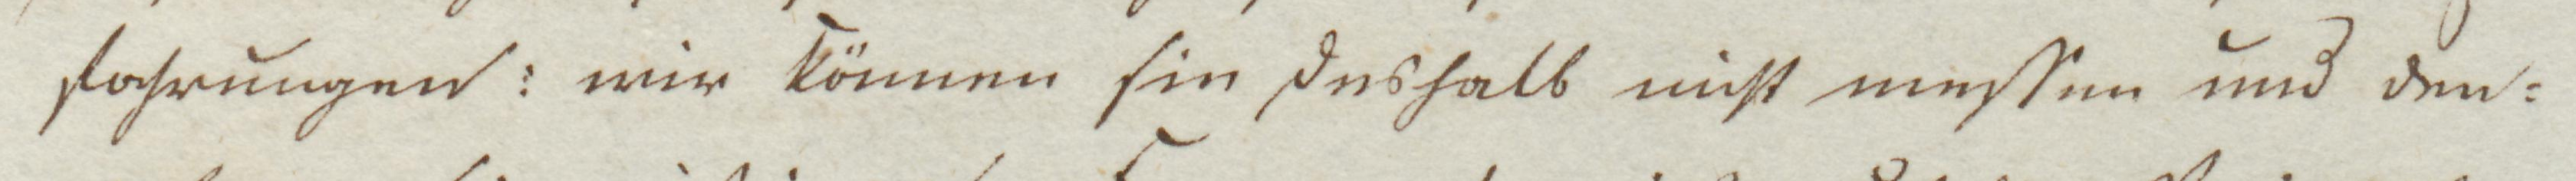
fahrungen: wir können sie deshalb nicht messen und den-
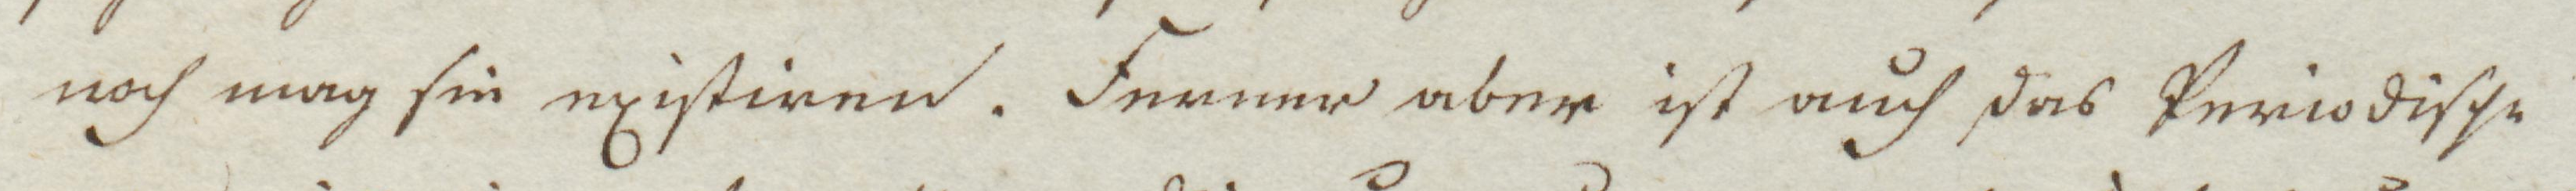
noch mag sie existiren. Ferner aber ist auch das Periodische
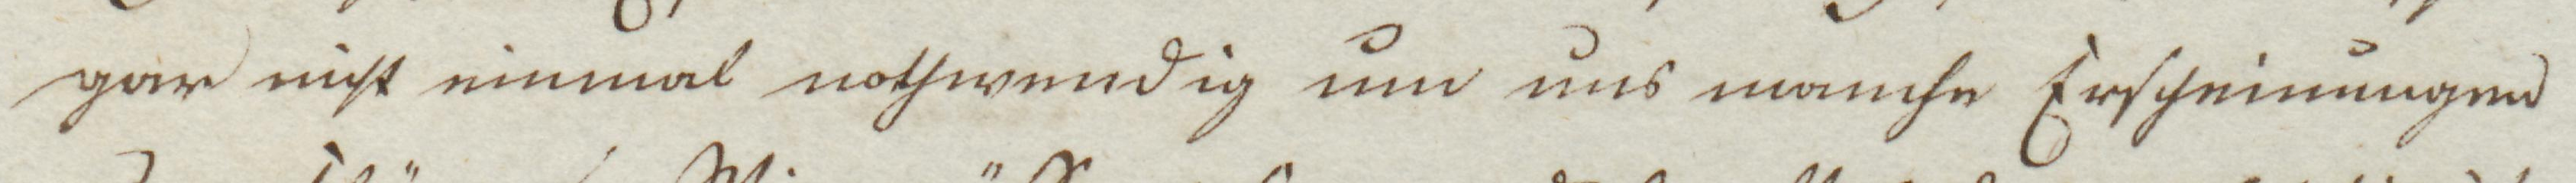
gar nicht einmal nothwendig um uns manche Erscheinungen
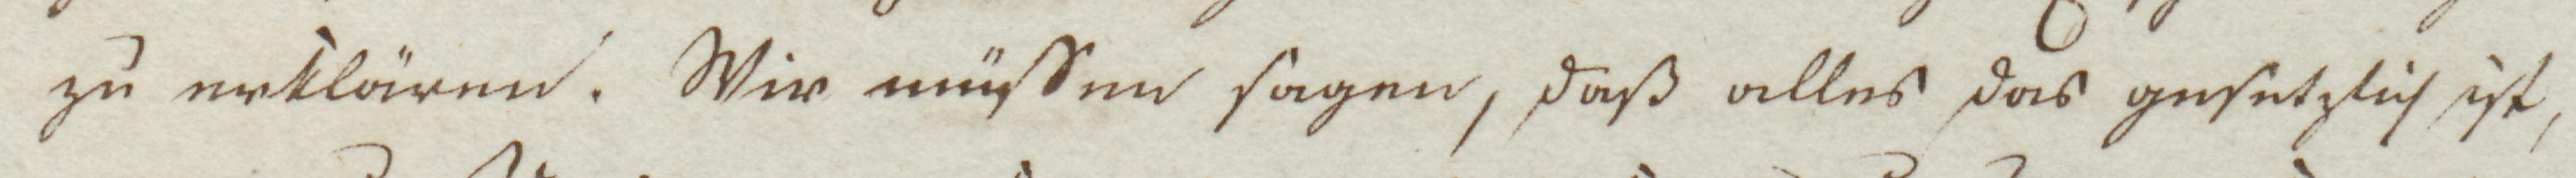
zu erklären. Wir müssen sagen, daß alles das gesetzlich ist,
